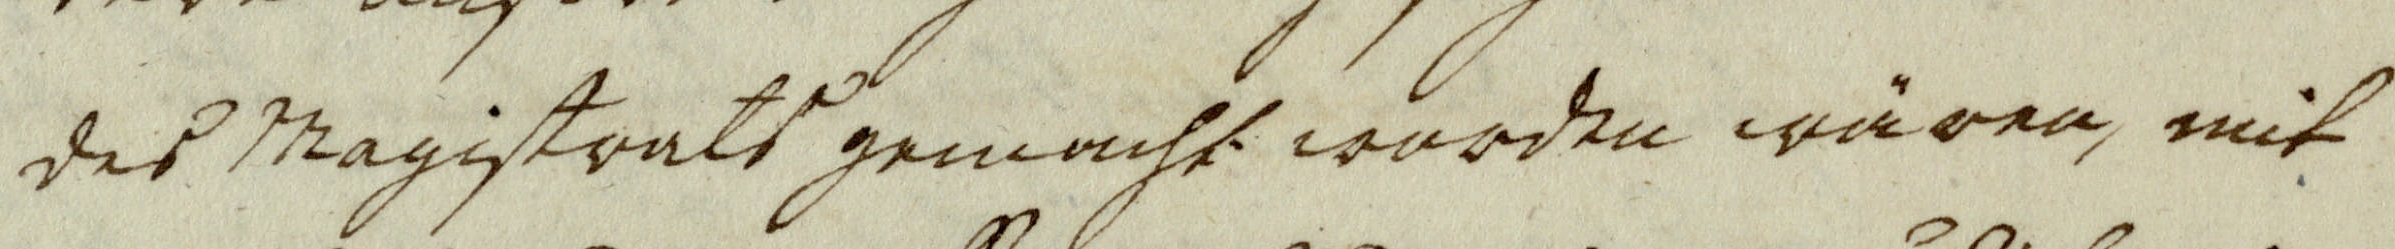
des Magistrats gemacht worden wären, mit
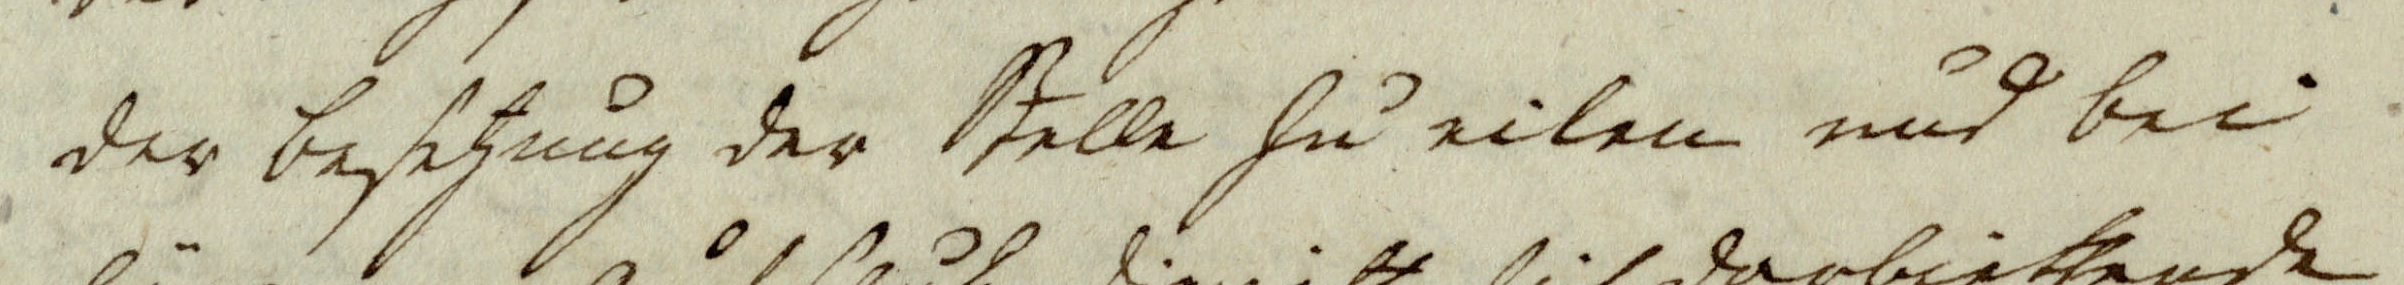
der Besetzung der Stelle zu eilen und bei
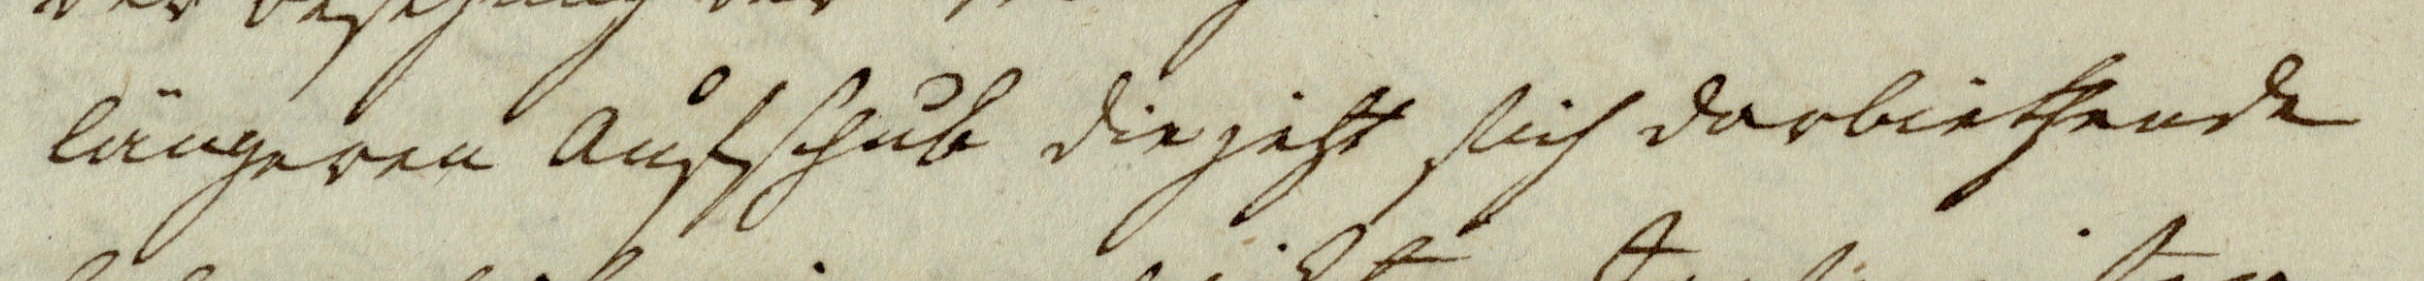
längeren Aufschub die jetzt sich darbietende
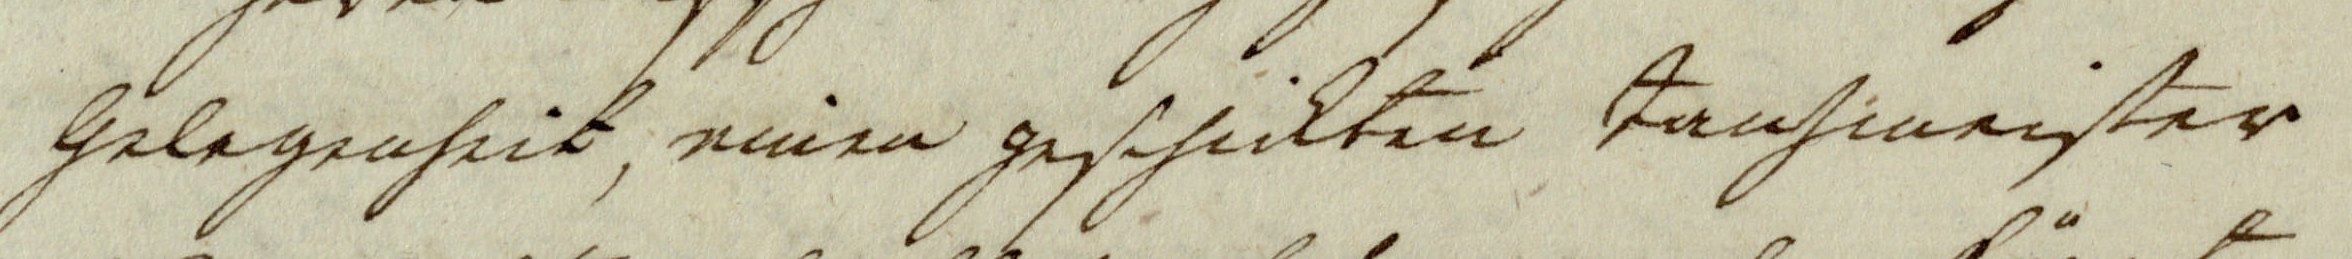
Gelegenheit, einen geschickten Tanzmeister
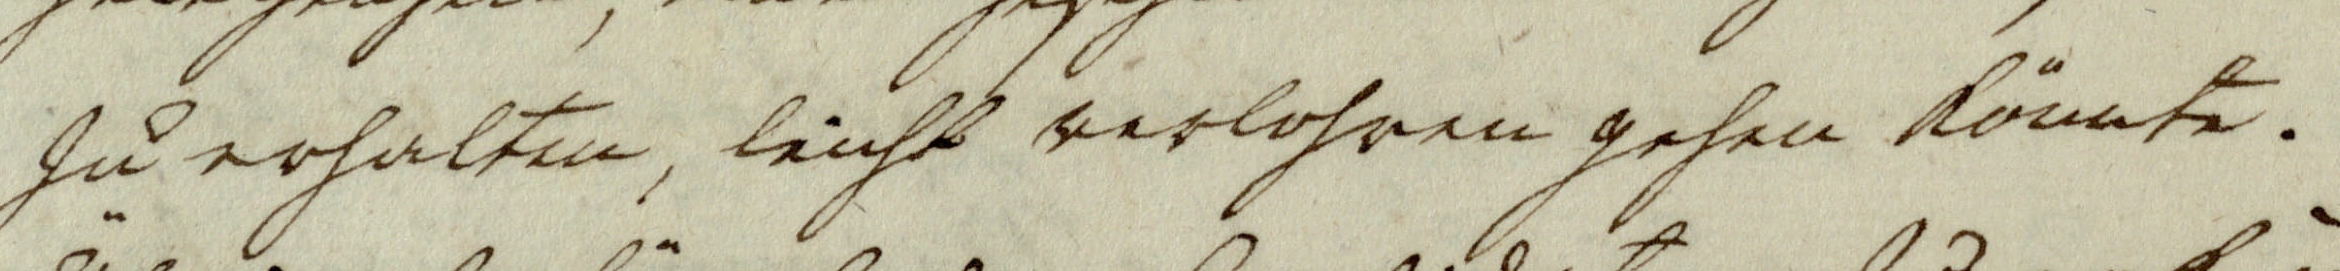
zu erhalten, leicht verlohren gehen könnte.
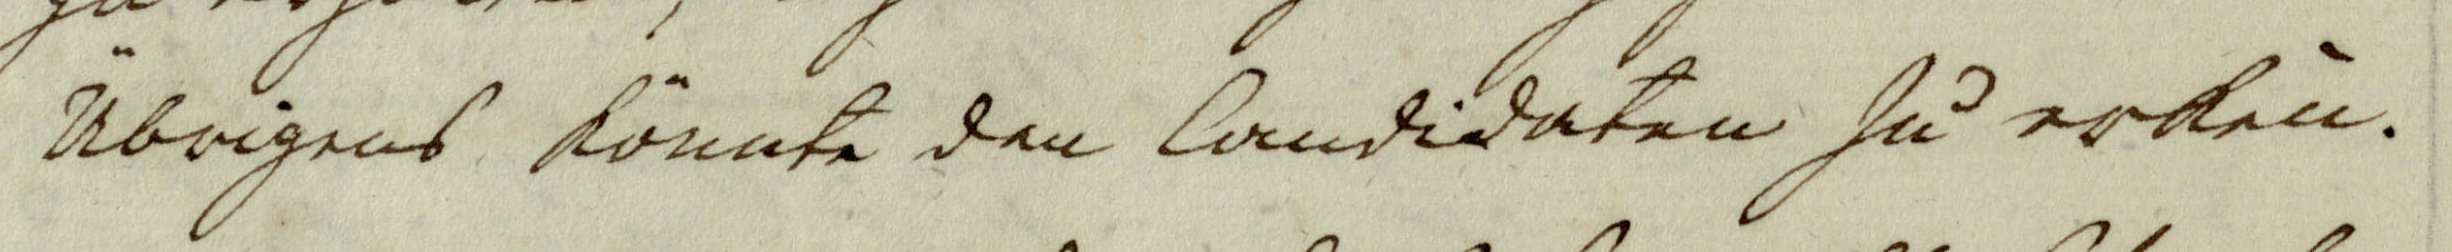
Übrigens könnte den Candidaten zu erken¬
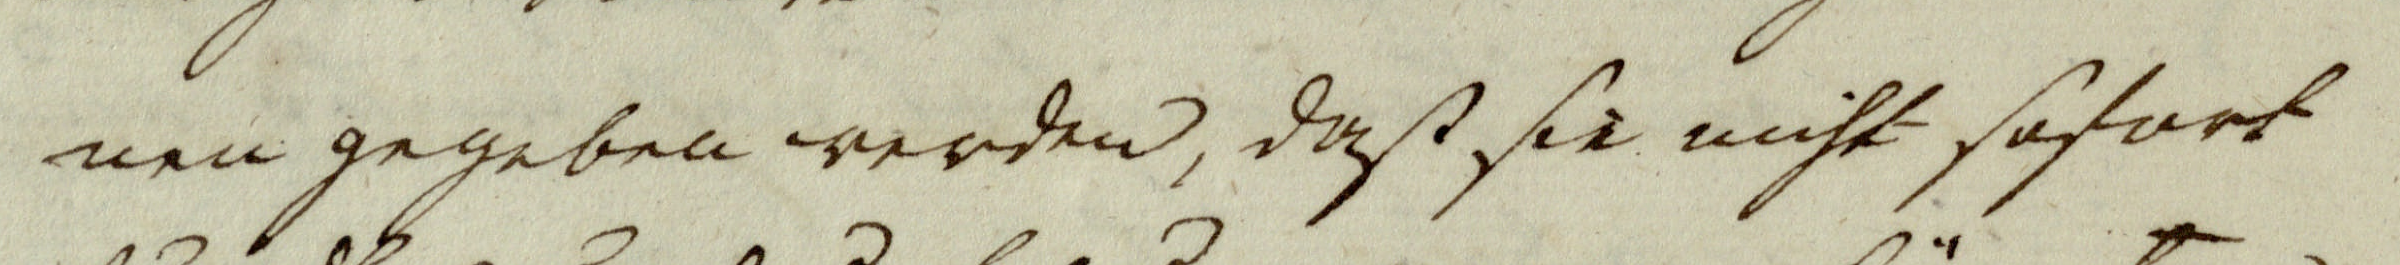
nen gegeben werden, daß sie nicht sofort
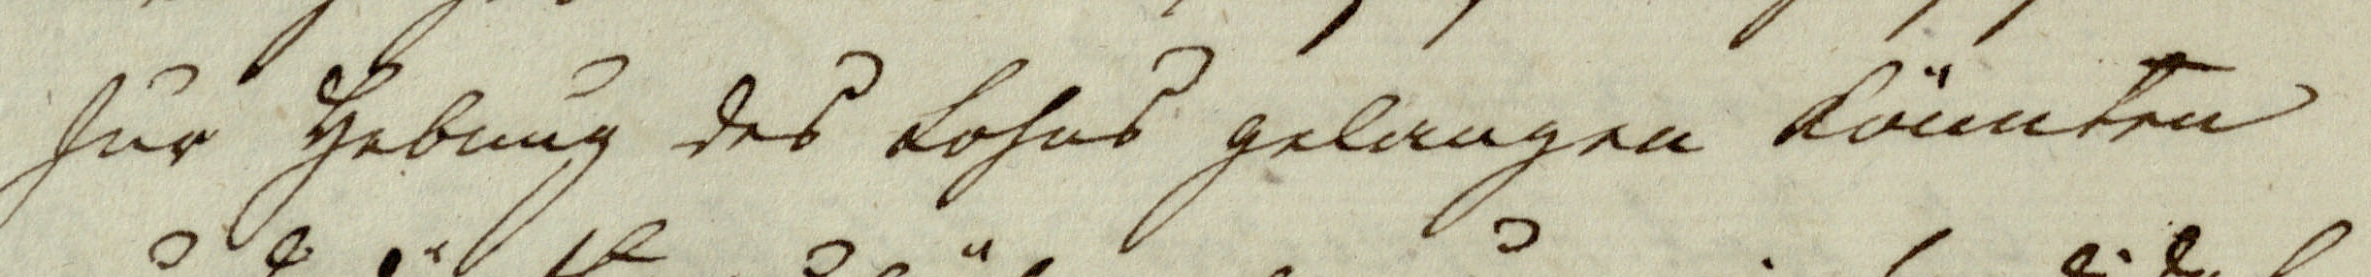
zur Hebung des Lohns gelangen könnten
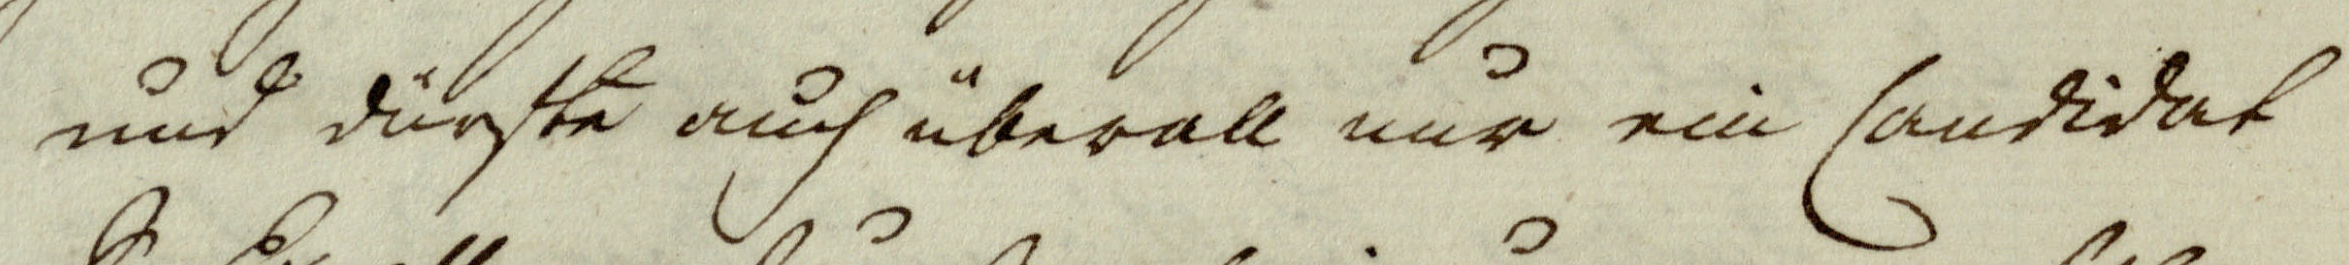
und dürfte auch überall nur ein Candidat
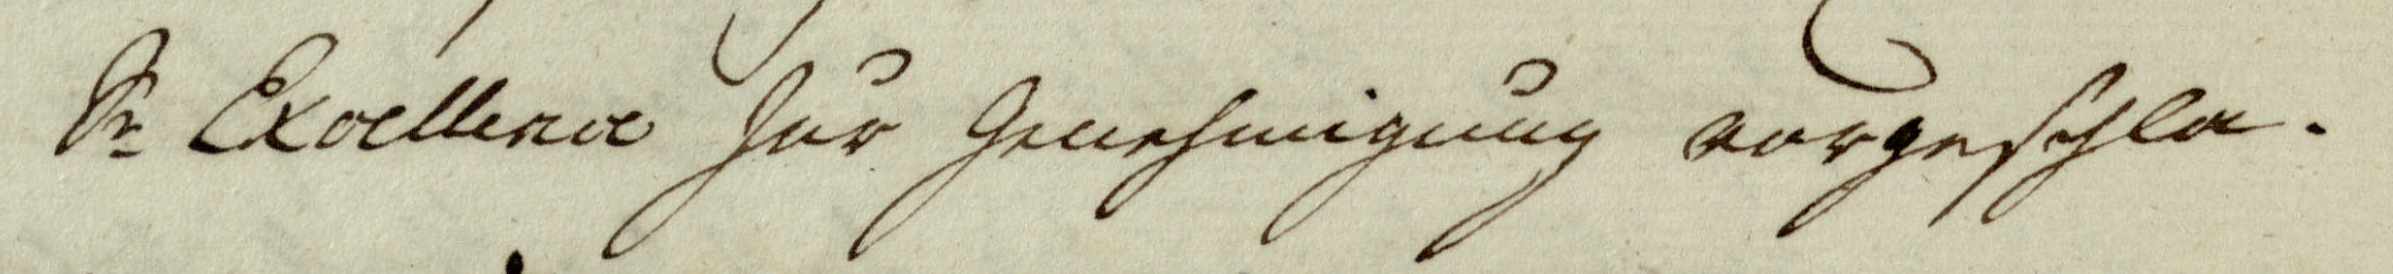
Sr Excellence zur Genehmigung vorgeschla¬
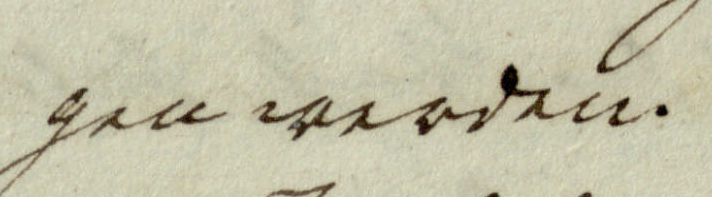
gen werden.
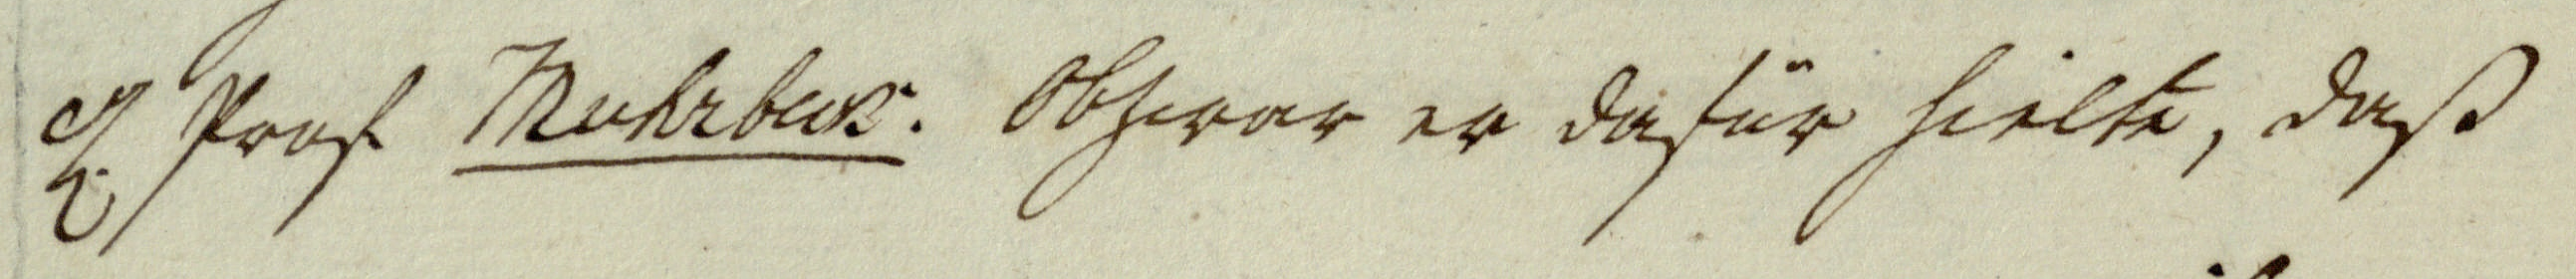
dh. Prof. Muhrbeck. Obzwar er dafür hielte, daß
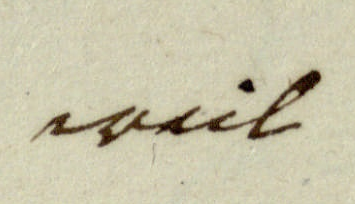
weil
